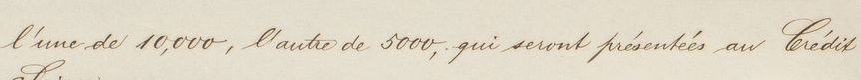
l'une de 10,000, l'autre de 5000, qui seront présentées au Crédit
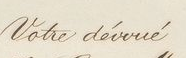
Votre dévoué
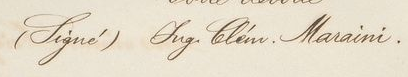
(Signé) Ing. Clém. Maraini.
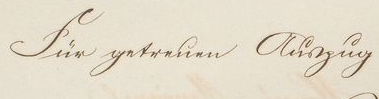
Für getreuen Auszug
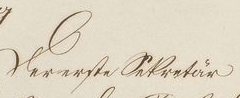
Der erste Sekretär
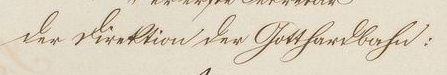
der Direktion der Gotthardbahn:
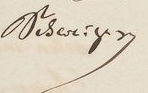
Schweizer
